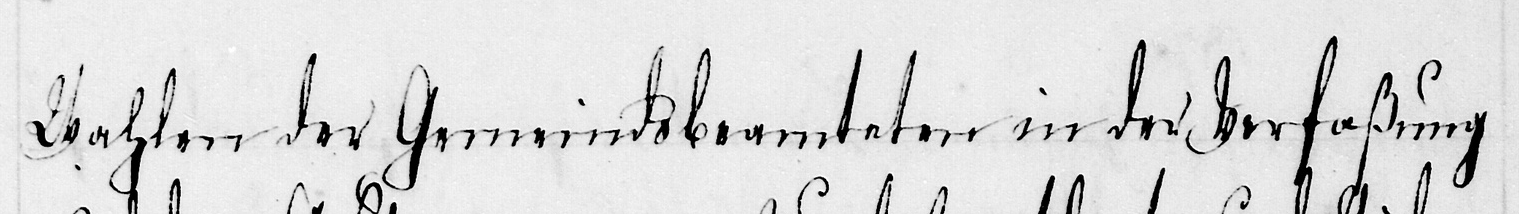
Wahlen der Gemeindsbeamteten in der Verfaßung
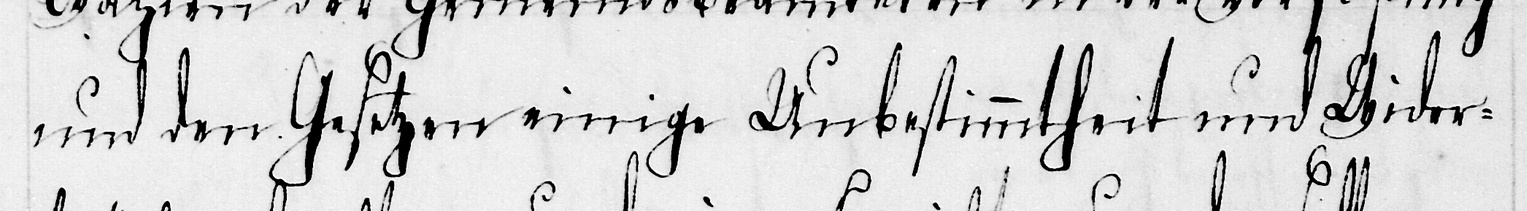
und den Gesetzen einige Unbestimmtheit und Wider¬
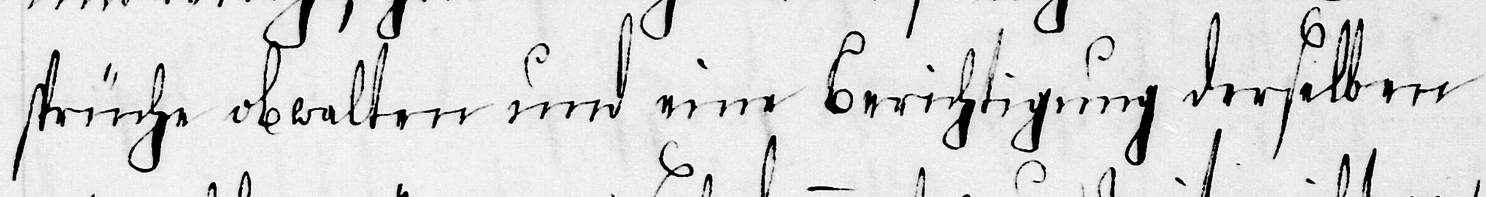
sprüche obwalten und eine Berichtigung derselben
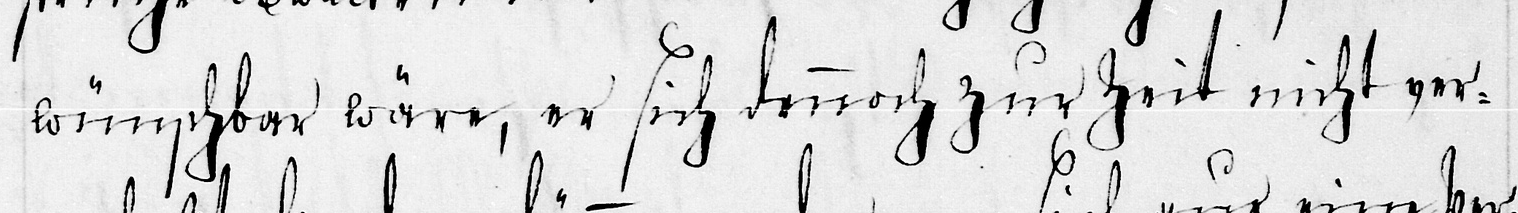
wünschbar wäre, er sich dennoch zur Zeit nicht ver¬
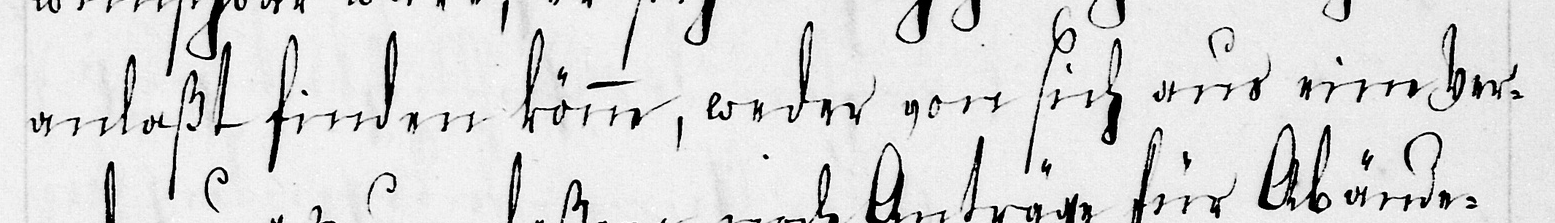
anlaßt finden könne, weder von sich aus eine Ver¬
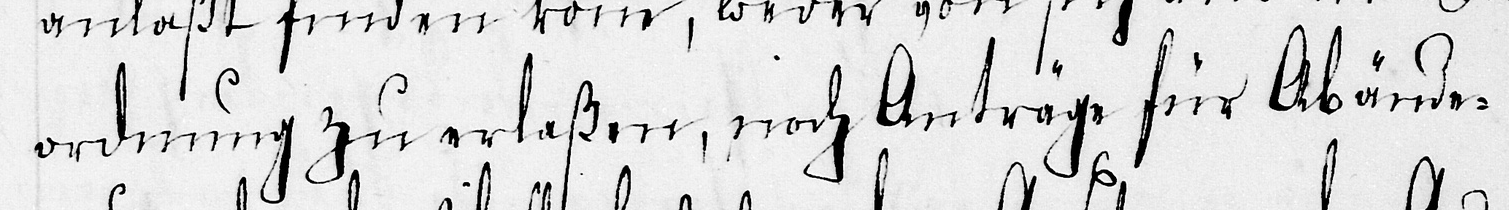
ordnung zu erlaßen, noch Anträge für Abände¬
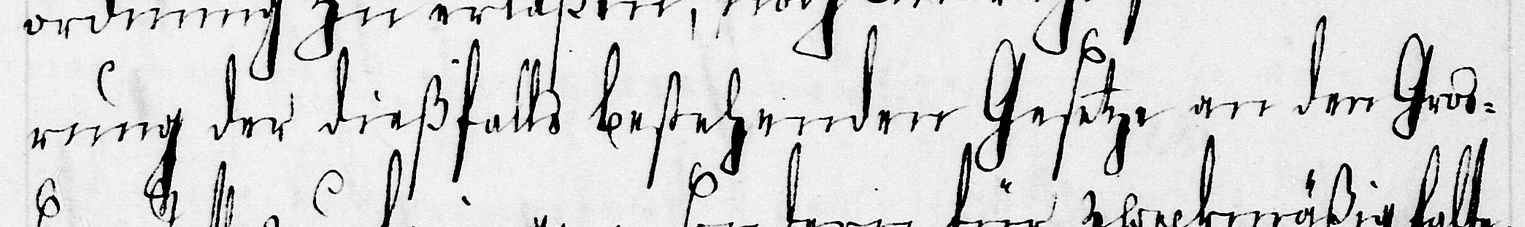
rung der dießfalls bestehenden Gesetze an den Groß¬
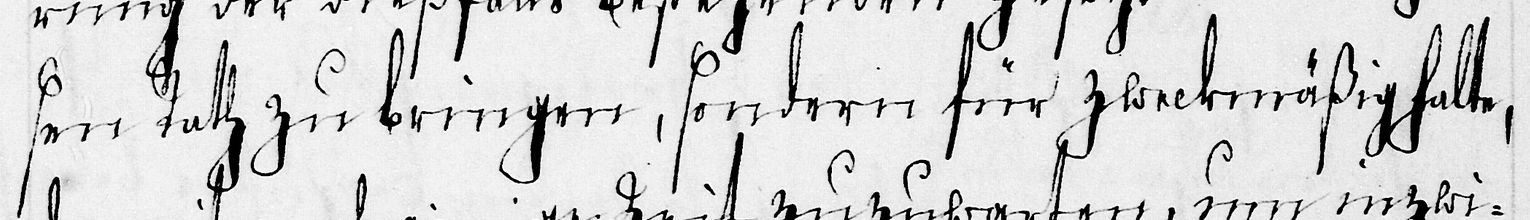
en Rath zu bringen, sondern für zweckmäßig halte,
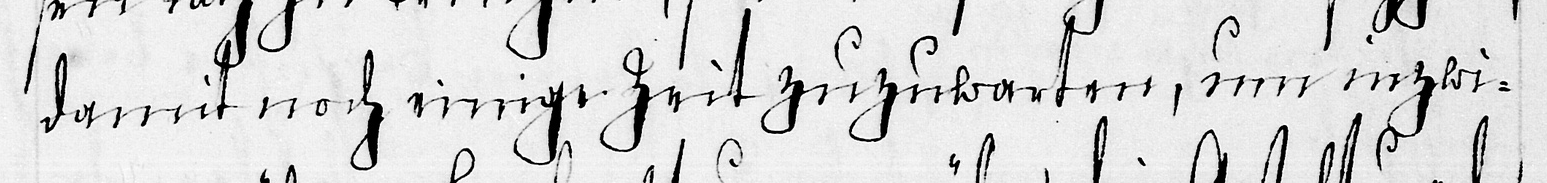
damit noch einige Zeit zuzuwarten, um inzwi¬
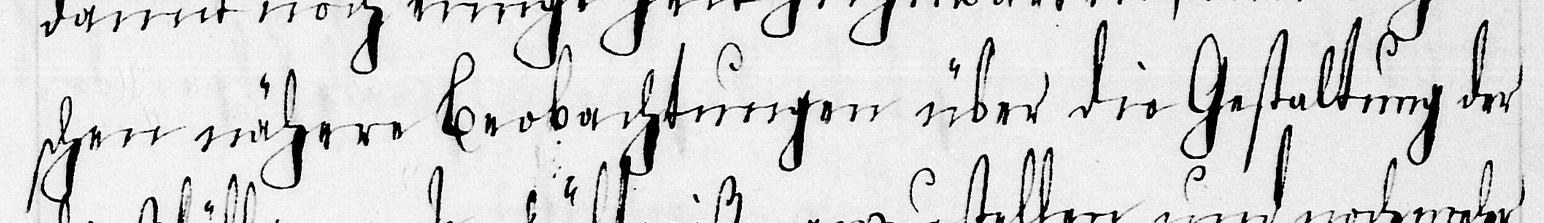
schen nähere Beobachtungen über die Gestaltung der
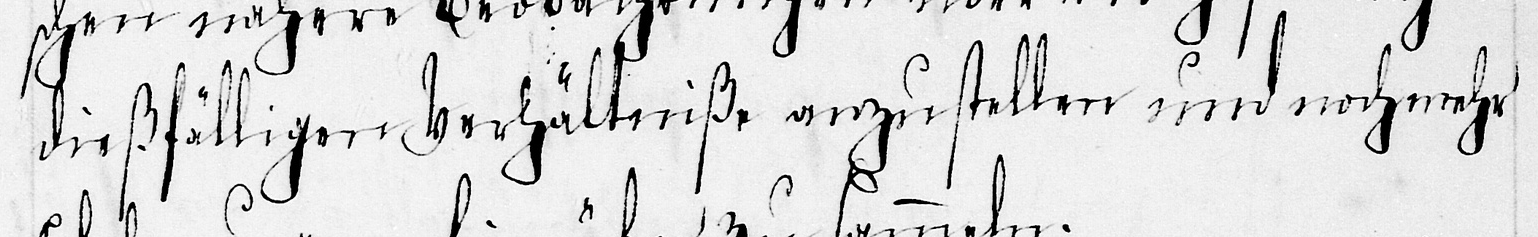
dießfälligen Verhältniße anzustellen und noch mehr
